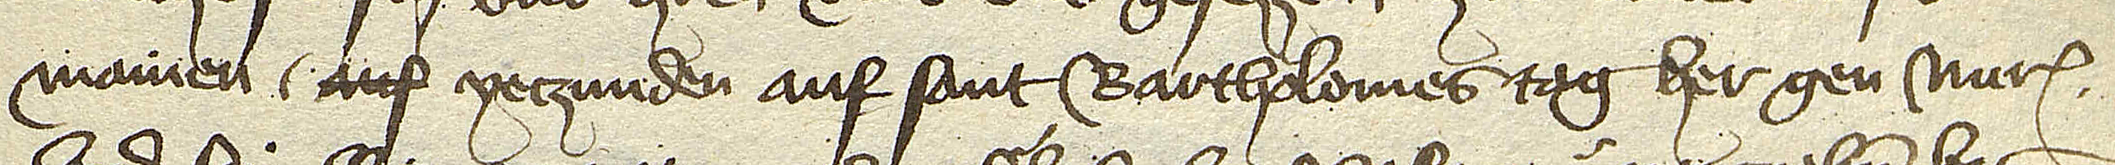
mainen / auf yecʒunden auf ſant Bartholomes tag her gen Nur*
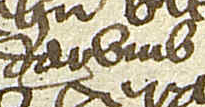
darvmb
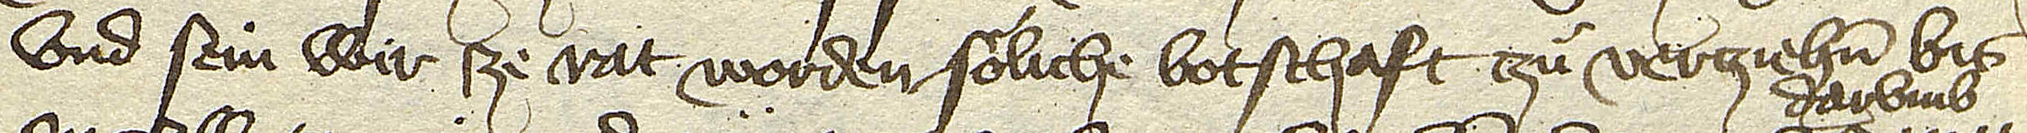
vnd ſein wir cʒe rat worden ſöliche botſchaft cʒü vercʒiehn* bis
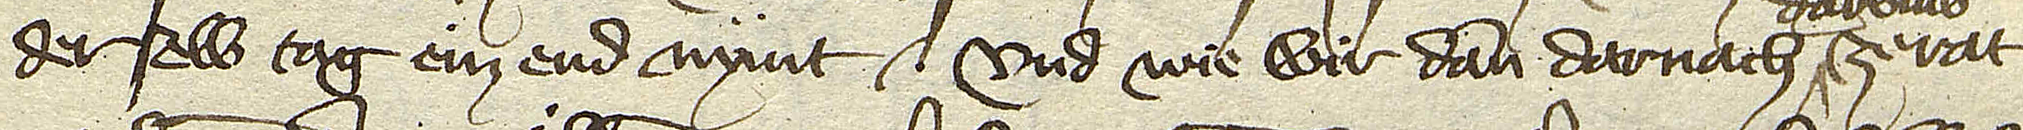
derſelb tag ein end nymt / . vnd wie wir dan* darnach cʒerat
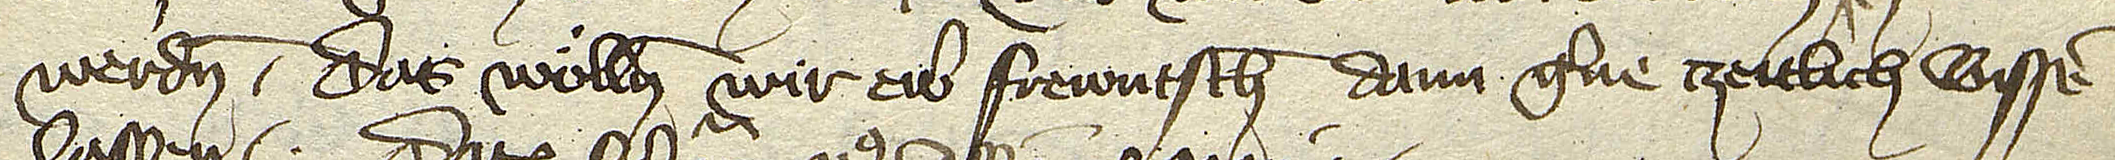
werdn* / Das wölln* wir ew* frewntſch* dann g*ne cʒeitlich wiſſe*
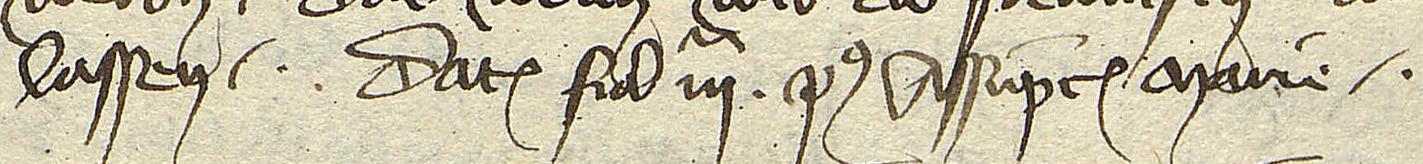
laſſen / . Dat* fia* iii* . p* Aſſupc* Marie / .
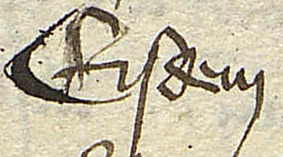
Eiſdem
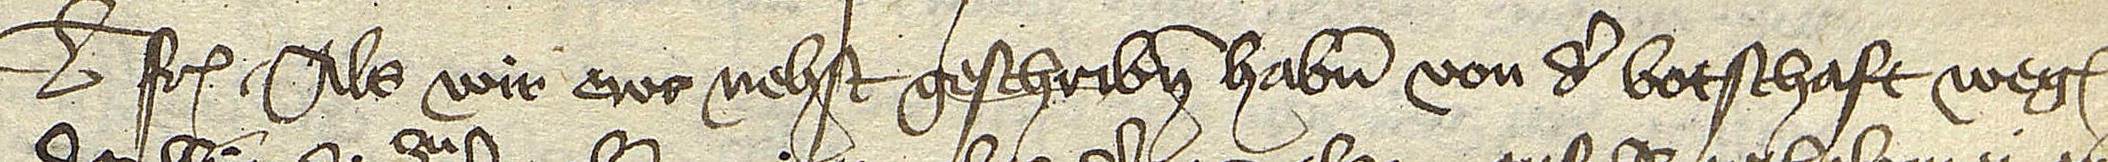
L* fr* / Als wir ewr nehſt geſchribn* habn* von d* botſchaft weg*
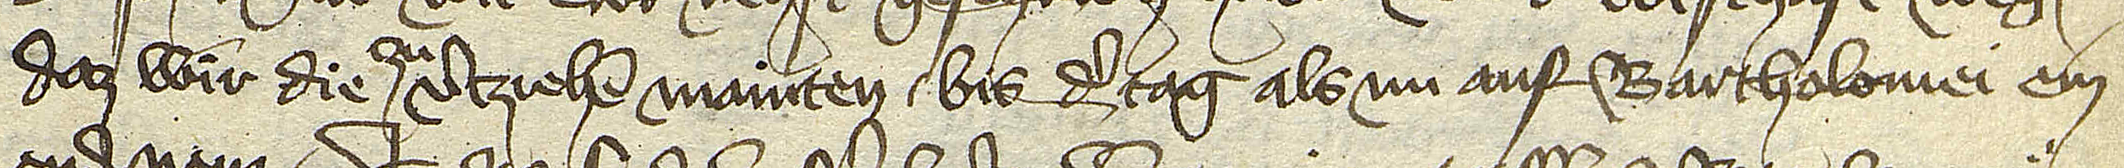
daʒ wir die v*cʒiehe* mainten / bis d* tag als nu auf Bartholomei ein
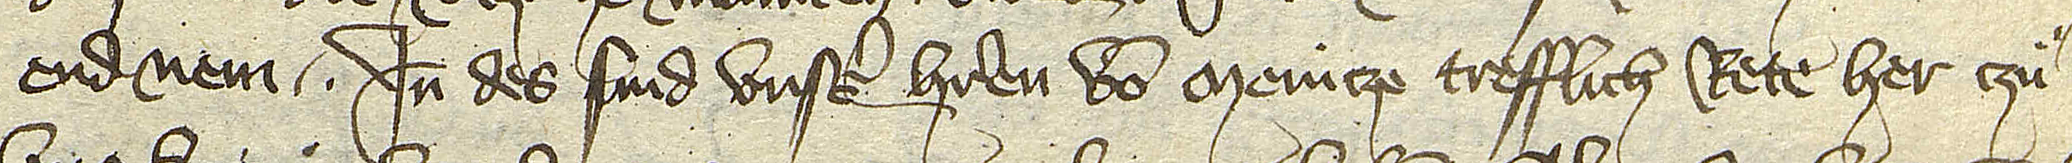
end dem / . In des ſind vnſs* hr*en vo* Meincʒe trefflich Rete her cʒü
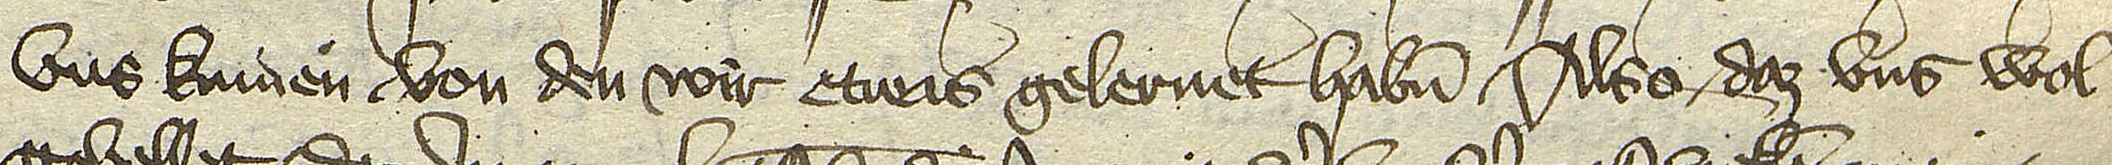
vns kumen / von den wir etwas gelernt habn* / Alſo / daʒ vns wol
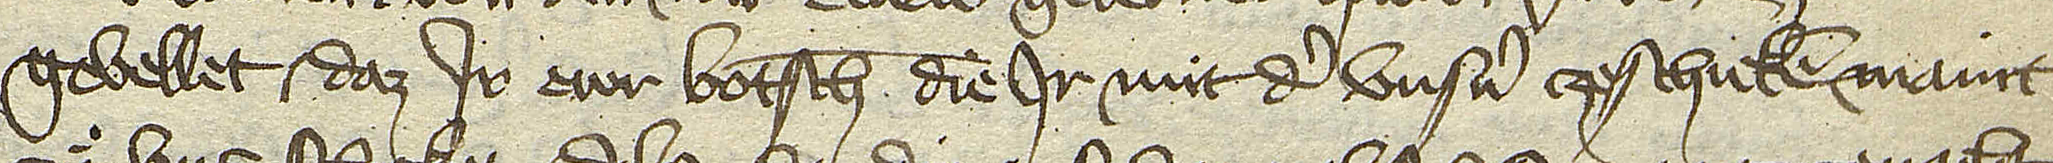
gevellet / daʒ Ir ewr botſch* die Ir mit d* vnſn* cʒeſchicke* maint
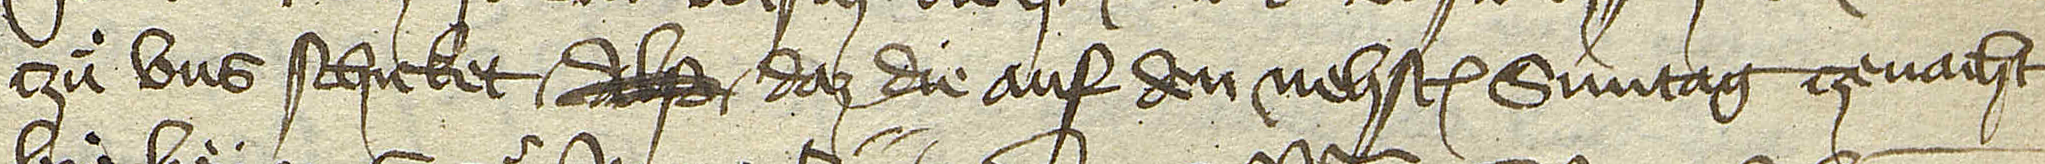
cʒü vns ſchicket / Alſo / daʒ die auf den nehſt* Suntag cʒenacht
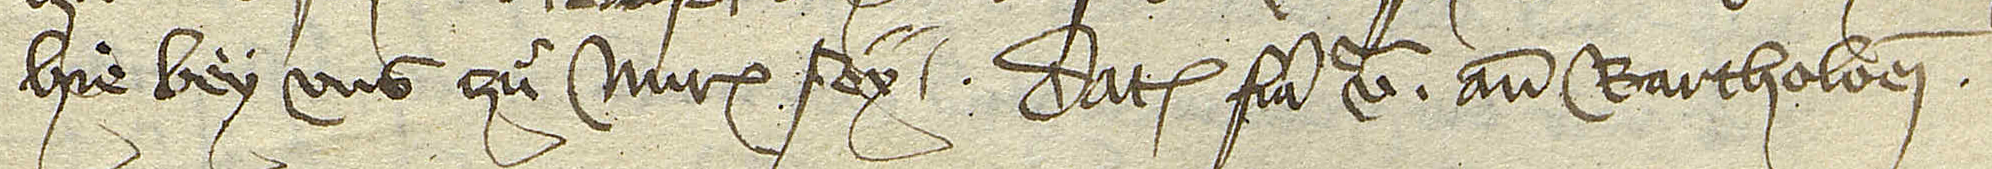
hie bey vns cʒü Nur* ſey / . Dat* fia* v* . an* Bartholoei* .
